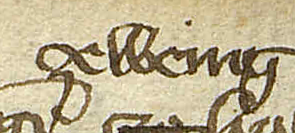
cʒewenig
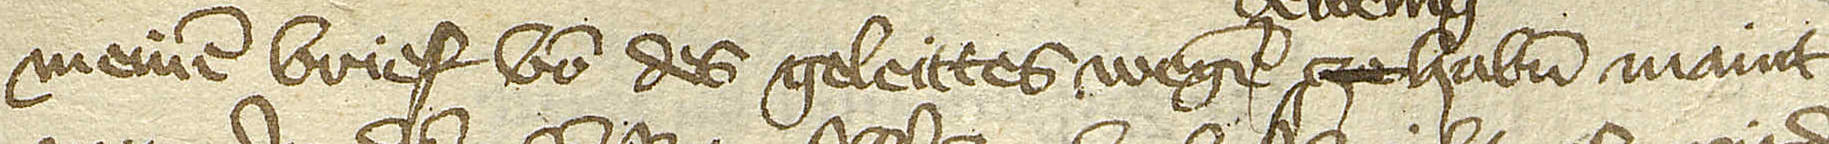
meine* brief vo* des geleittes wege / cʒe habn* maint
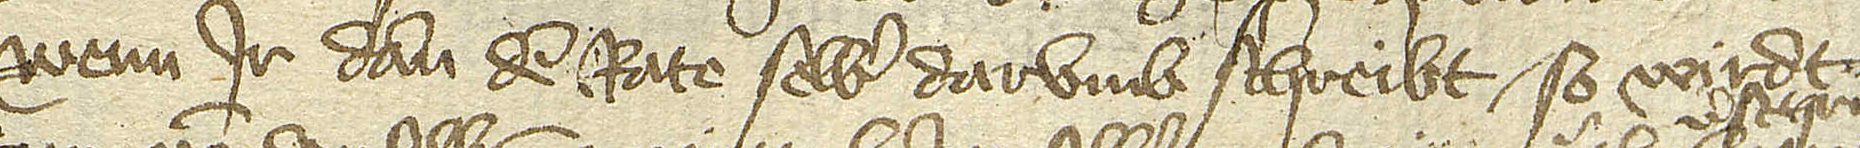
wenn Ir dan* d* Rate ſelb* darvmb ſchreibt / ſo wirdt
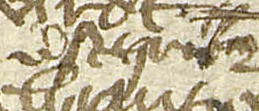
v*ſchribn*
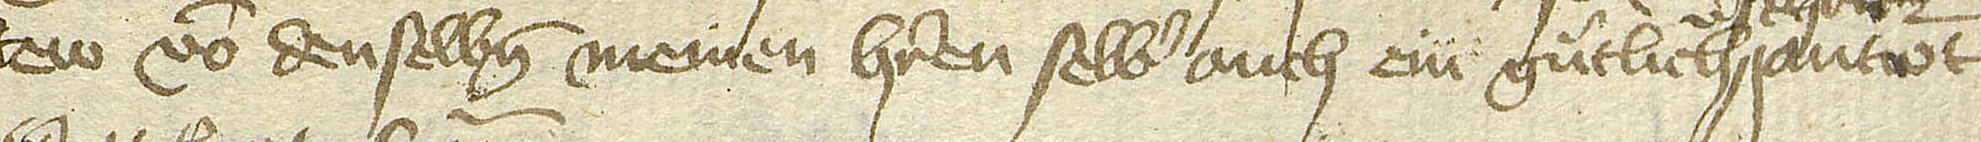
ew vo* denſelbn* meinen hr*en ſelb* auch ein gütlich antwt*
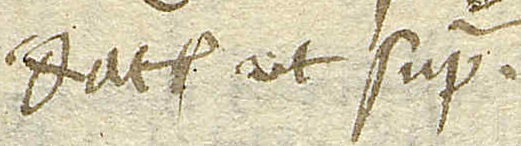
dat* vt ſup*.
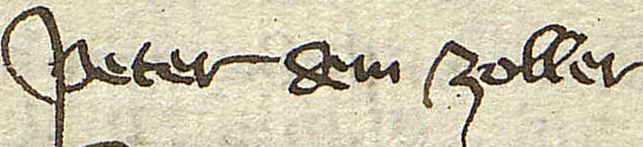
Peter dem cʒoller
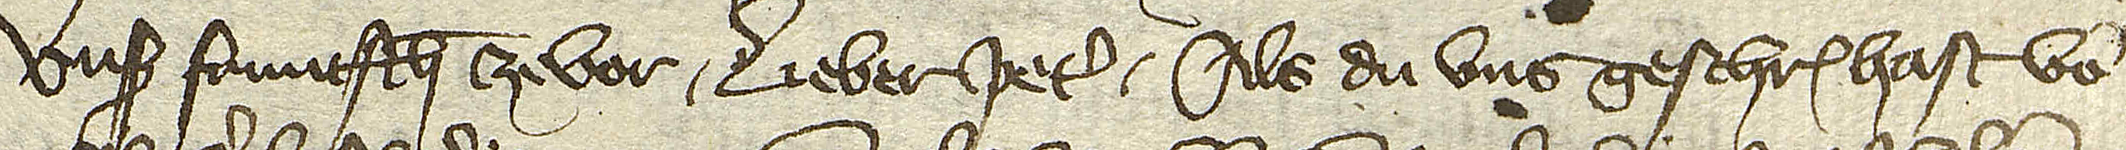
Vnſ* fruntſch cʒevor / Lieber Pet* / Als du vns geſchr* haſt vo*
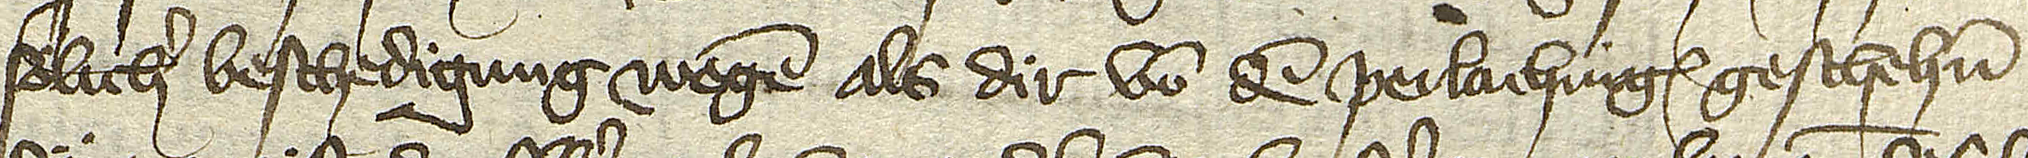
ſölich* beſchedigung wege* als dir vo* d* perlaching* geſchehn*
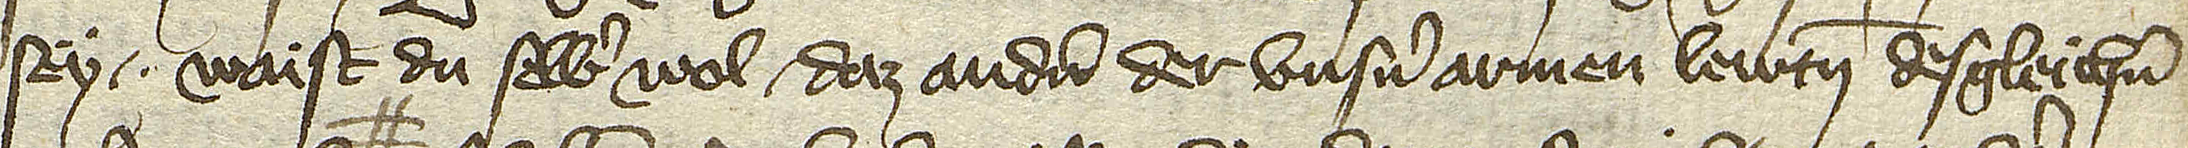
ſey / . waiſt du ſelb* wol / daʒ andn* der vnſn* armen lewtn* deſgleichn*
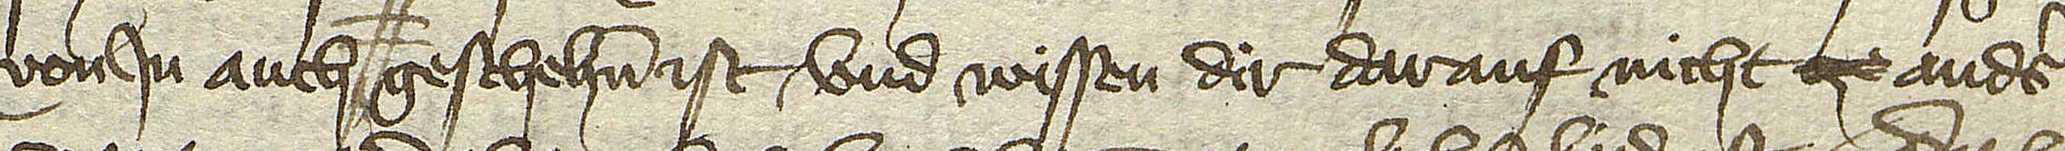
von In auch geſchehn* iſt / vnd wiſſen dir darauf nicht cʒe ands*
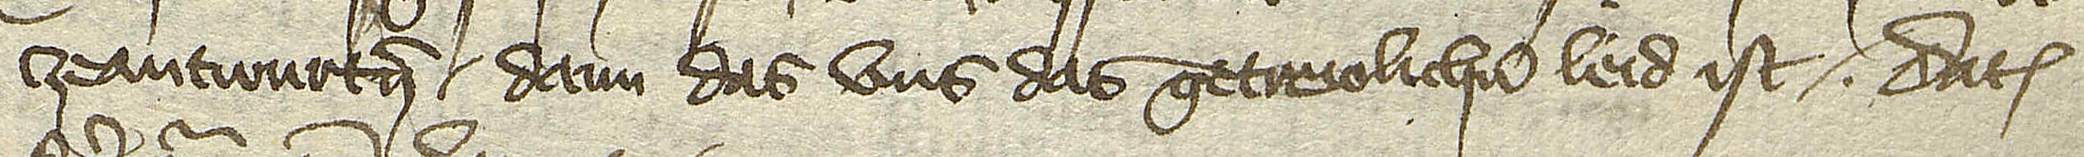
cʒeantwurtn* / dann das vns das getrewlichn* leid iſt / . Dat*
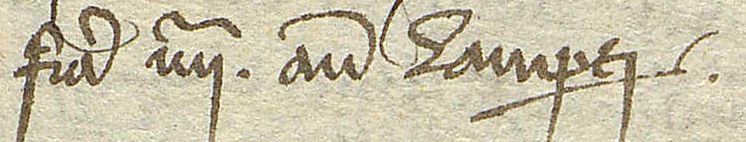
fia* iiii* . an* Lamp*ti / .
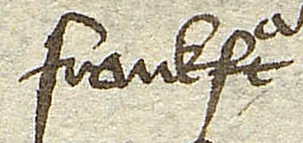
Frankf*t
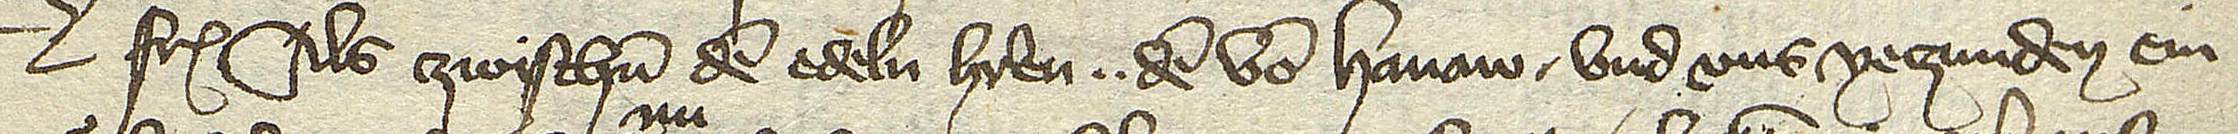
L* fr* Als cʒwiſchn* d* edeln hr*en ~ d* vo* hanaw / vnd vns yecʒunden ein
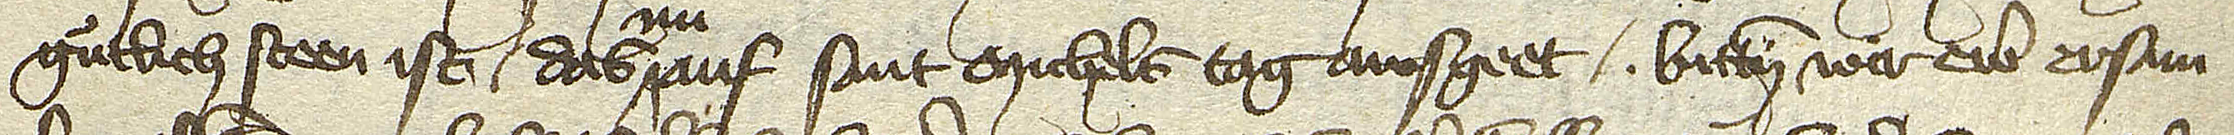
gütlich ſteen iſt / das auf ſant Michels tag awſgeet / . bittn* wir ew* erſam
